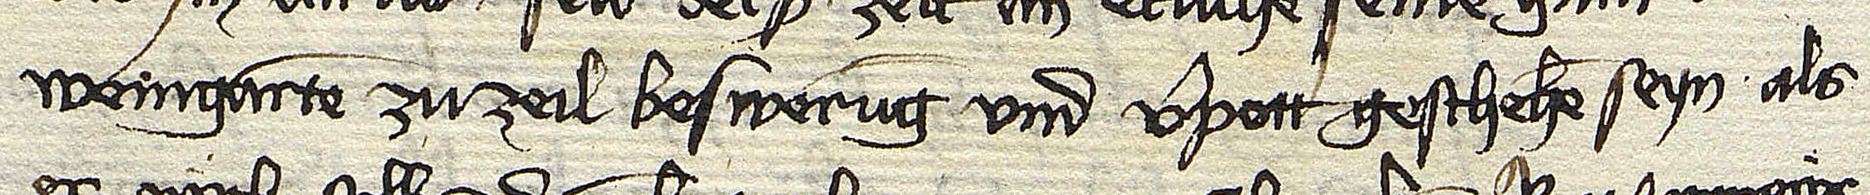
weingarte* ʒu ʒeil beſweru*g vnd v*pott geſchehe* ſeyn . als
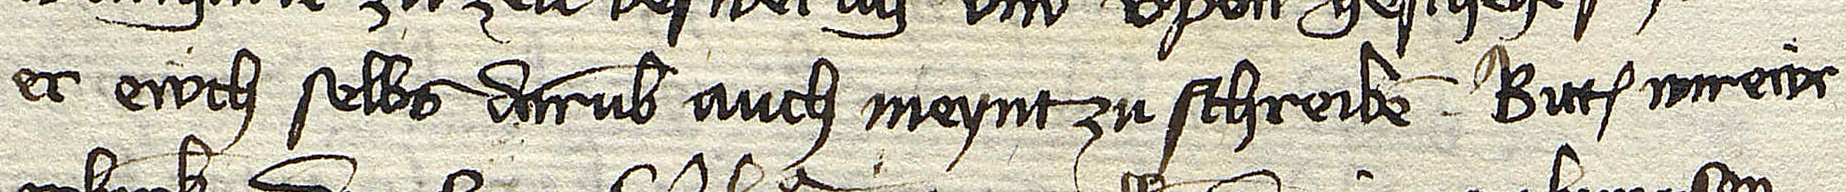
er ewch ſelbs darub* auch meynt ʒu ſchreibe* . Bitt* wir ewr
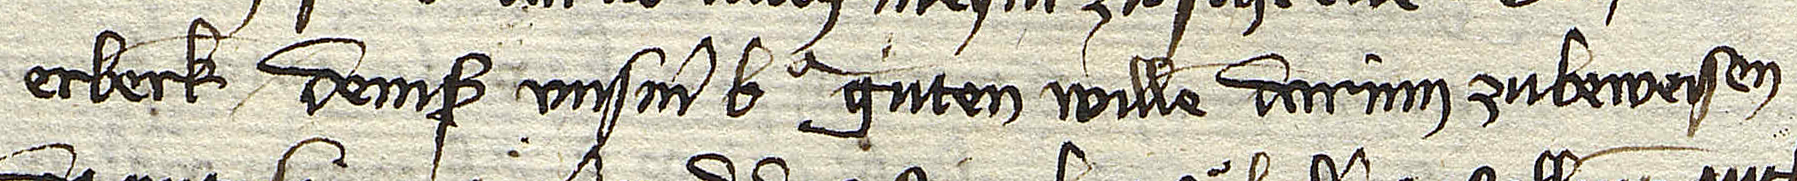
erberk* / Demſ* vnſ*m b* guten wille* darinn ʒu beweiſen
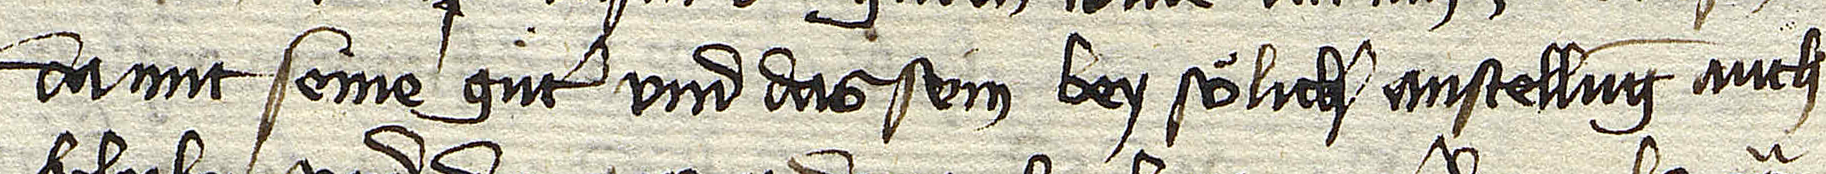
da mit ſeine güt* vnd das ſein bey ſölich* anſtellu*g auch
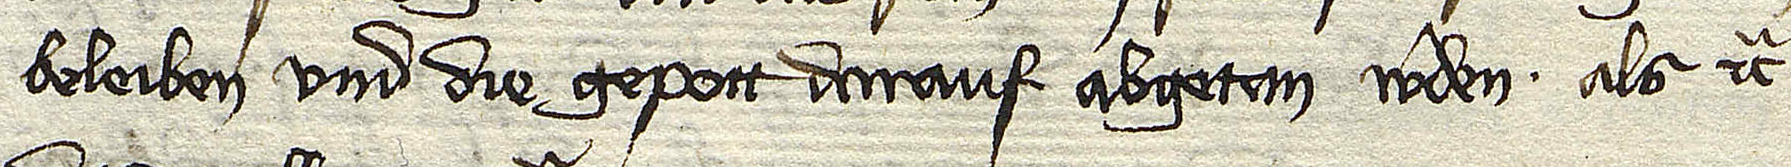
beleiben vnd die gepott darauf abgetan w*den . als ec*
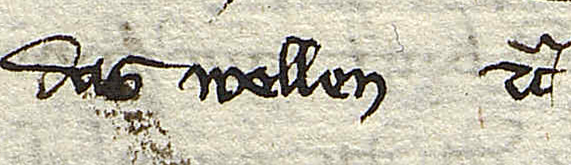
das wellen ec*
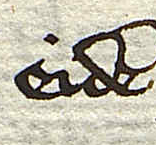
eide*
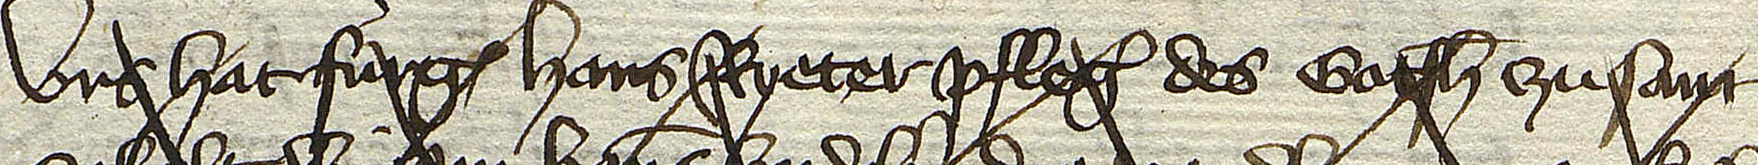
Vns hat fürg* hans Ryeter pfleg* des Gotſh* cʒu ſant
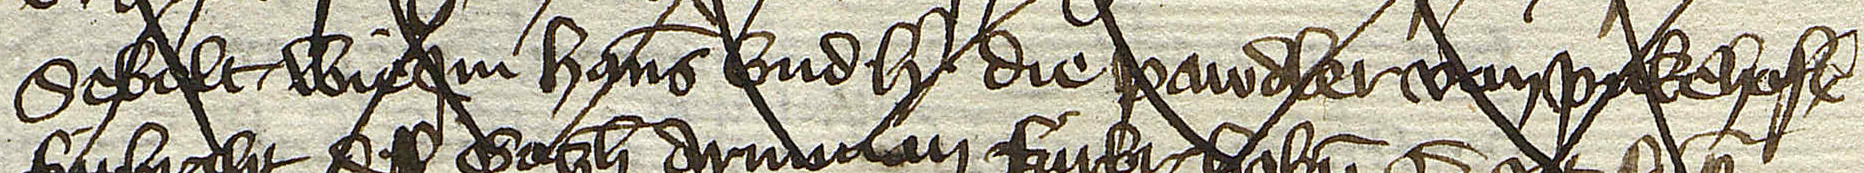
Sebolt / wie Im han*s vnd h* die pawdler von puke*hofe*
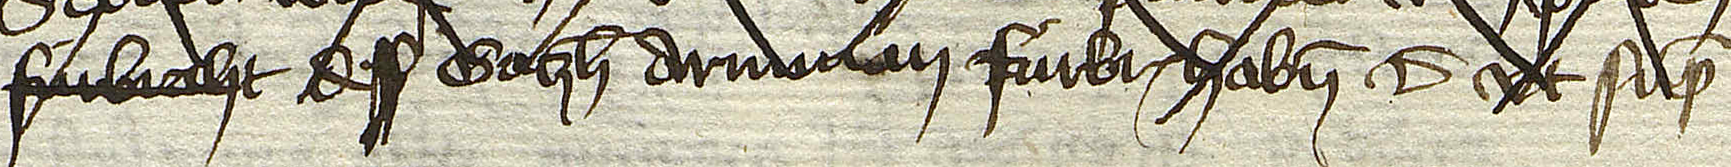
fürbraht deſſ* Gocʒh* Armman fürbr* hab*n ec* vt ſup*
